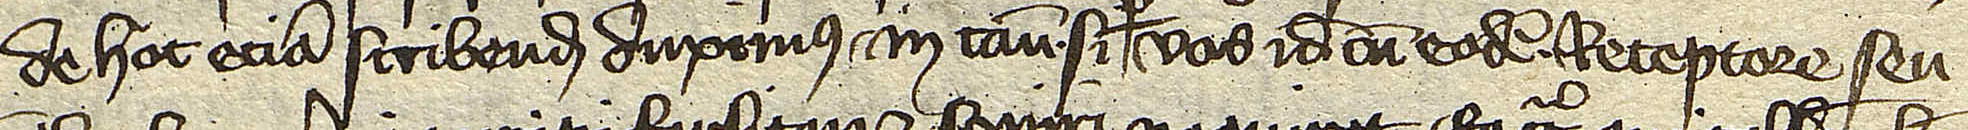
de hoc ecia* ſcribend* duxim* / in cauſ* vos id in eod* Receptore ſeu
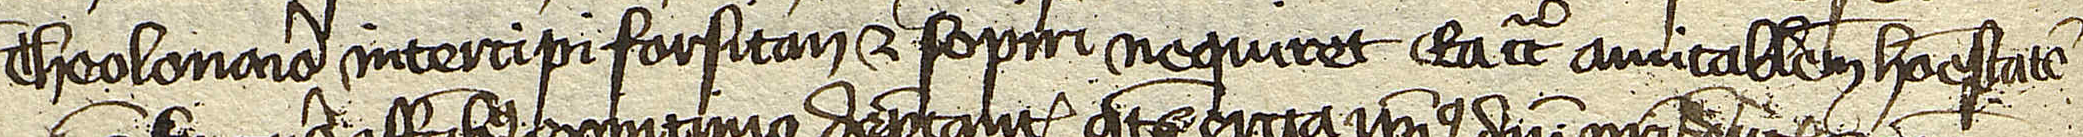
Theolona*io intercipi forſitan @ ſopiri nequiret / Ea ec* amicab*lem ho*eſtate*
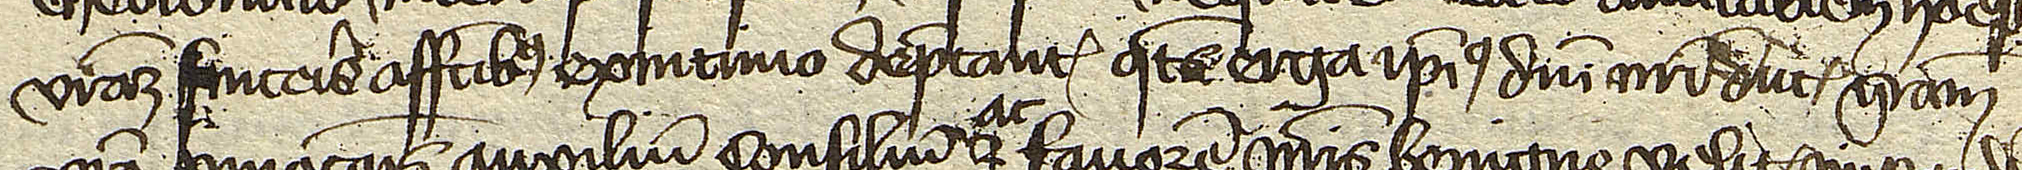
v*ra* ſince*is aff*c*ib* ex intimo dep*tant* q*t*s erga ip*i* d*ni n*ri dict* gr*am
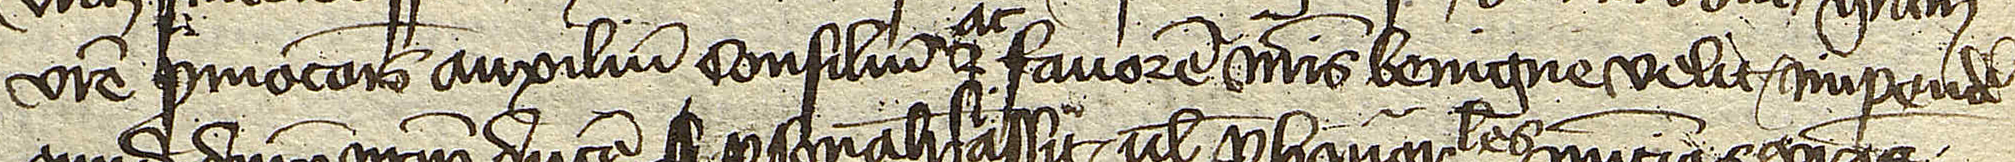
v*re p*mot*is auxiliu* Conſiliu* ac fauore* n*ris benigne velit* impend*
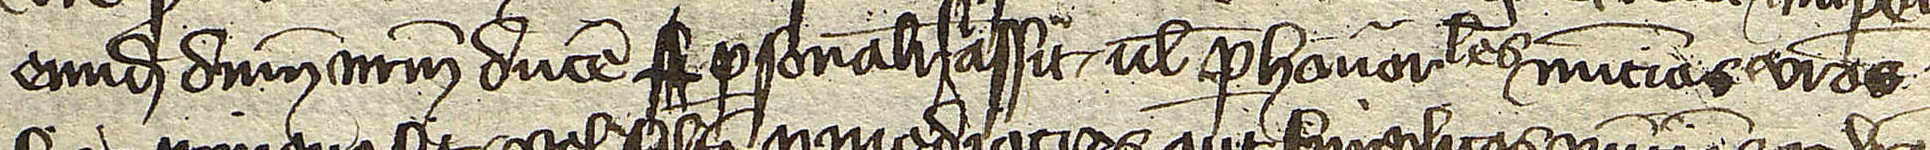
eund* d*n* n*r*m duce* %% p*ſonaliter faſſit / u*l p* honor* nu*cios v*ros
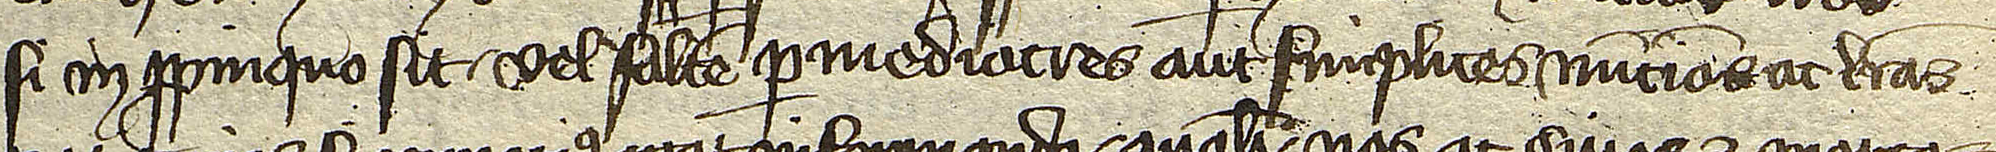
ſi in p*pinquo ſit / vel ſalte* p* mediocres aut ſimplices nu*cios ac v*ras
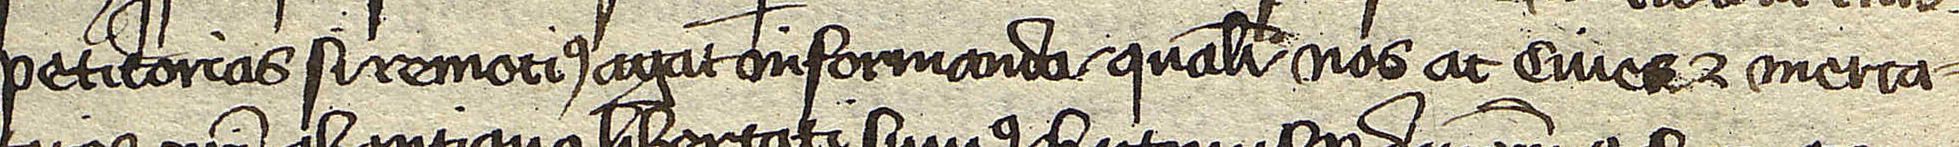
petitorias ſi remoti* agat informanda / qual*r nos ac Ciues @ merca =
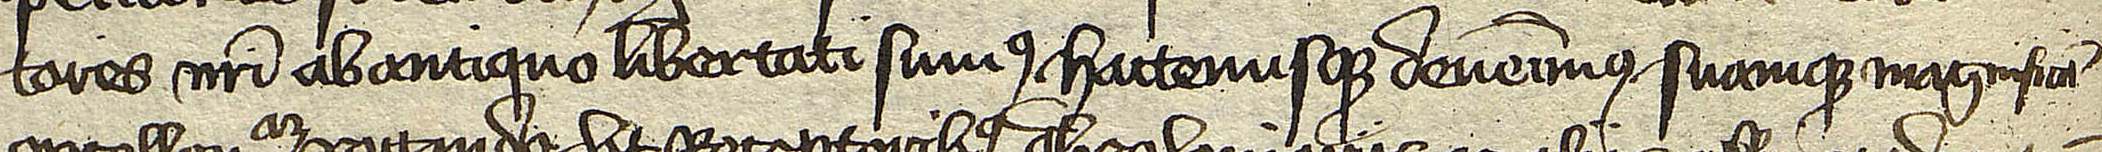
tores n*ri ab antiquo libertati ſum* / hactenuſq* deue*im* / ſuamq* magnifica*
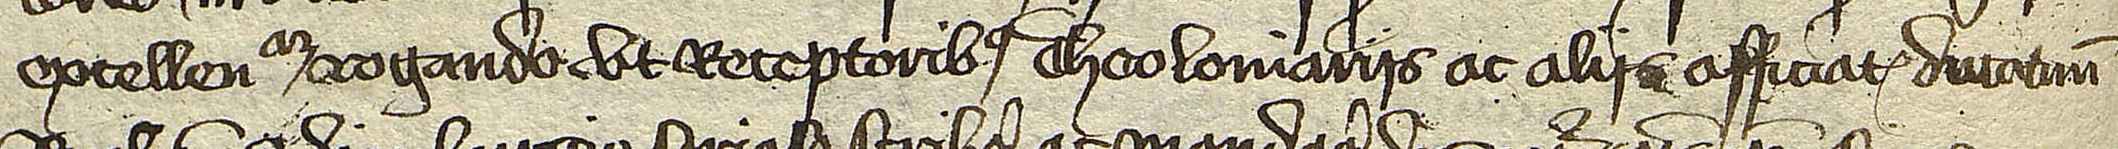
excellen*am rogando / vt Receptorib* Theoloniariis ac aliis officiat* ducatuu*
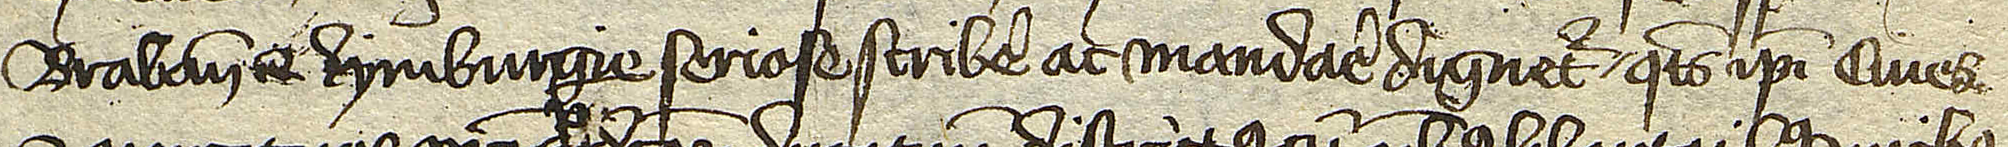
Braban* @ Lymburgie ſerioſe ſcribe* ac manda*e dignet* / q*t*s ip*i Ciues
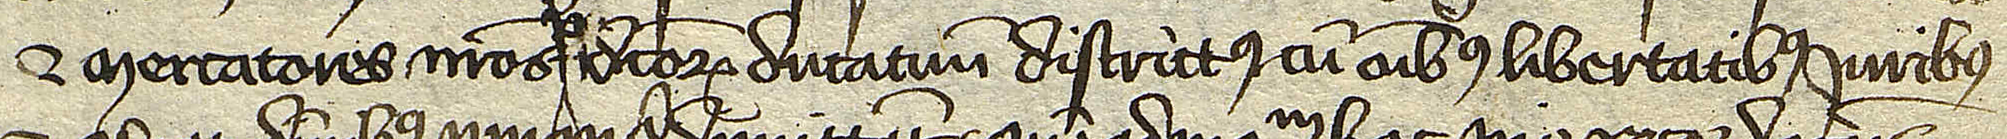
@ Mercatores n*ros p*dic*o* ducatuu* diſtrict* cu* o*ib* libertatib* Iurib*
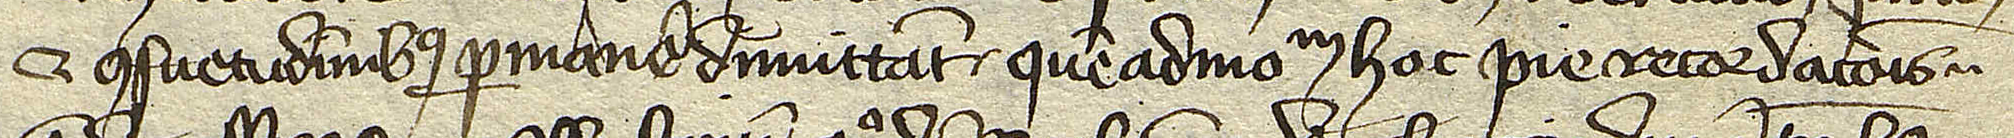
@ *ſuetidinib* p*mane* dimitta*t / que*admo*m hoc pie recordacio*is ~
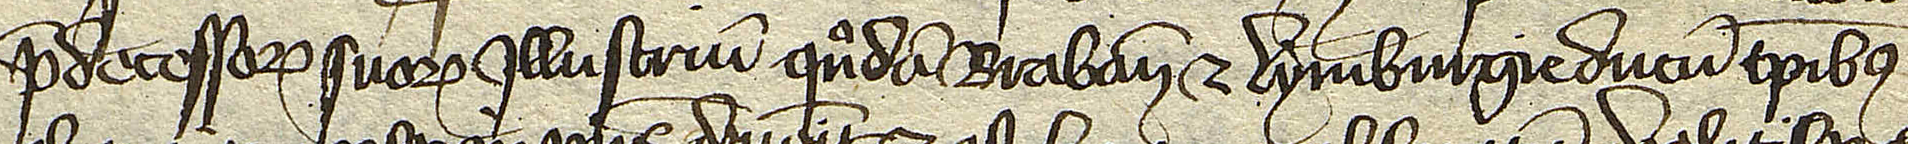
p*deceſſor* ſuo* Illuſtriu* quo*da* Braban* @ Lymburgie ducu* t*p*ib*
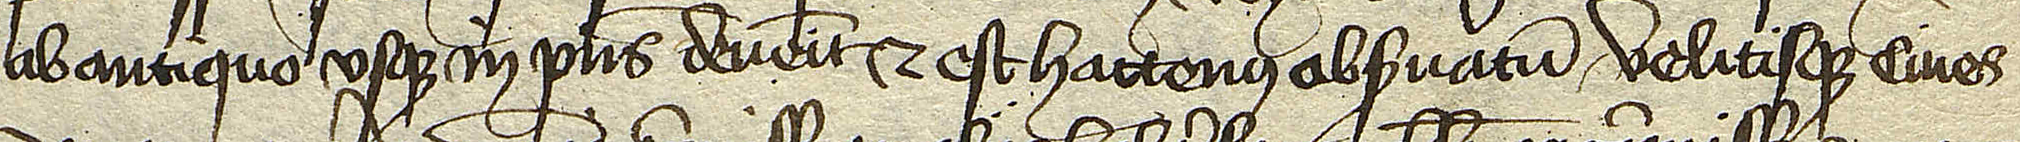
ab antiquo vſq* in p*ns deue*it @ eſt hacten* obſ*uatu* / velitiſq* Ciues
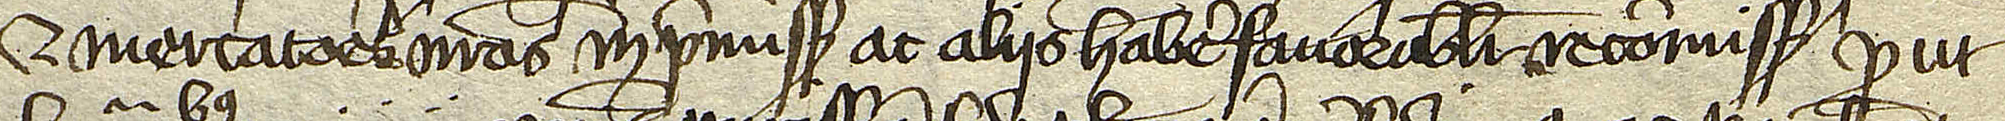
@ mercato*es n*ros in p*miſſ* ac aliis habe* fauorib*l*r reco*miſſ* p*ut
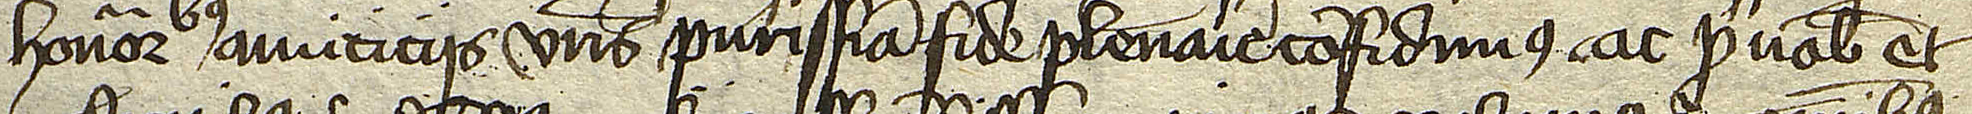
honor*b* amiciciis v*ris. Puriſſi*a fide co*fidim* / ac p* uob* et
